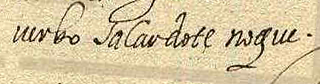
uerbo sacardote no que.
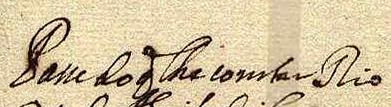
Passe do q̄ lhe constar Rio
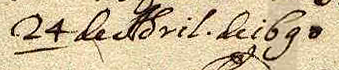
24 de Abril. de i690
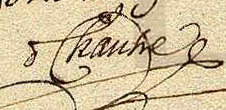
o Chantre
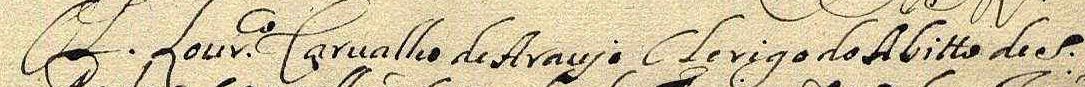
O L.do Lour.ço Carualho de Araujo Clerigo do Abitto de S.
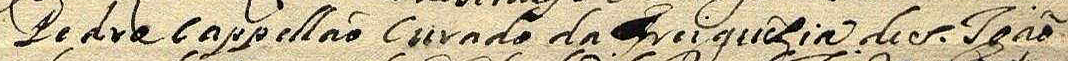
Pedro cappellaõ curado da freiguezia de S. Ioaõ
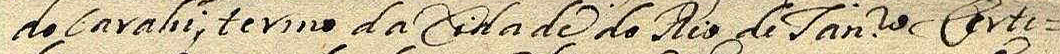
do Carahi, termo da Cidade do Rio de Ian.ro Certe
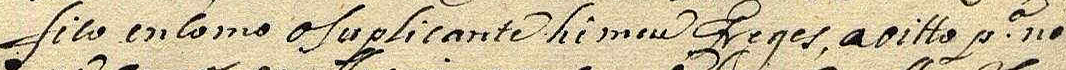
fico en como o suplicante hé meu Freges, a oitto p.a no
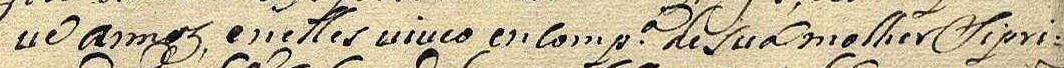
ue annoz, e nelles uiueo en comp.a de sua molher Sipri
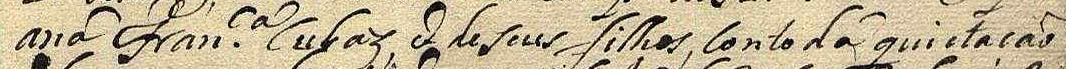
ana Fran.ca Cubaz & de seus filhos, con toda quietaçaõ
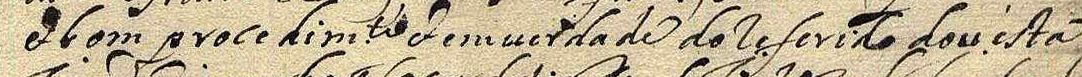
e bom procedim.to & em uerdade do Referido dou esta
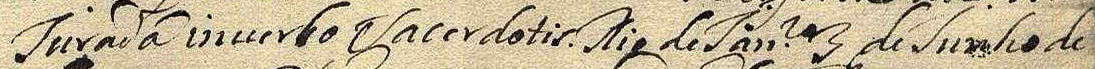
Iurada in uerbo Sacerdotis. Rio de Ian.ro 3 de Iunho de
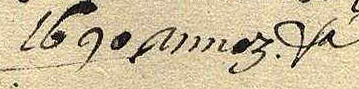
1690 annos. &a
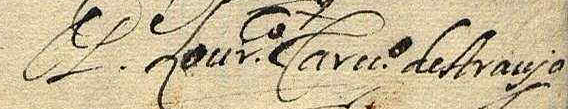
O P.e Lour.ço Caru.o de Araujo
